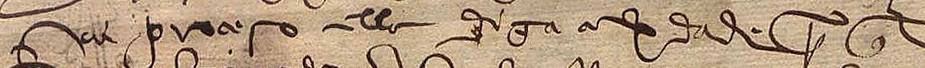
seu proçeso ella diga a ꝟdade p̄o q̄
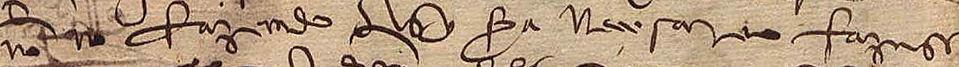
nō no fazemdo Asy ꞩa neçesario fazerse
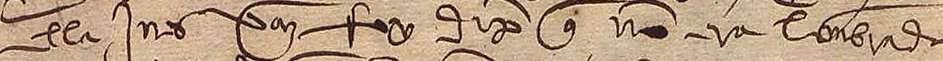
ella Jnes Vāz foy dit̄o q̄ nō era lembrada
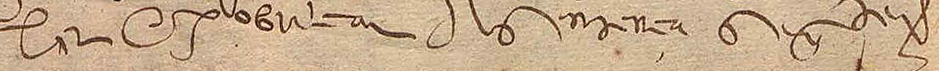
ler e pobricar A sentença seḡte
